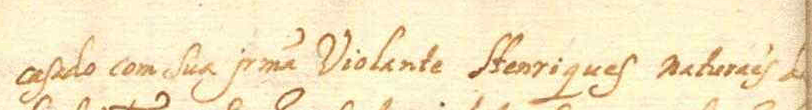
casado com sua jrmã Violante Henriques naturaes d
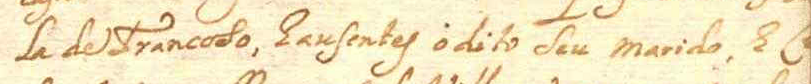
La de Trancoso, E ausentes o dito seu marido, E C
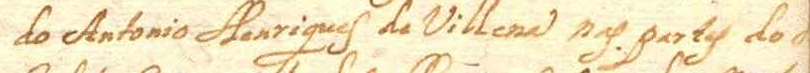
do Antonio Henriques da Villena nas partes do
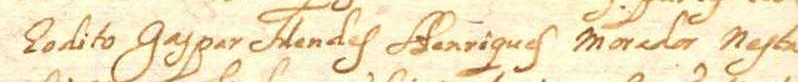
E o dito Gaspar Mendes Henriques morador nesta
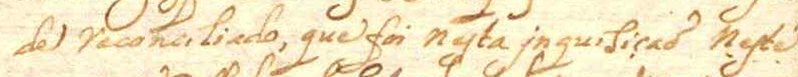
de reconciliado, que foi nesta jnquisiçaõ neste
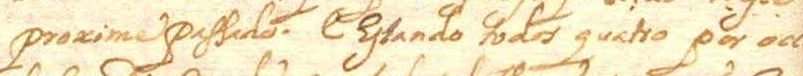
proxime passado. E Estando todos quatro por occ
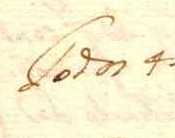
Todos 4.
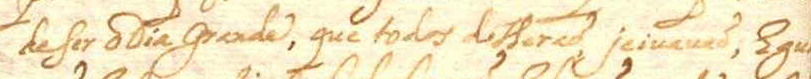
de ser o dia Grande, que todos disseraõ jeiuauaõ, E gu
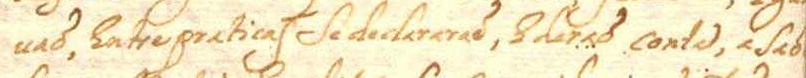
uaõ, Entre praticas se declararaõ, E deraõ conta, e sab
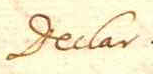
Declar.
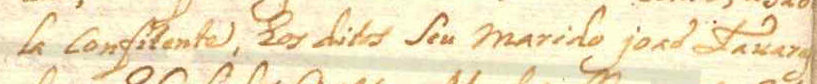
la confitente, E os ditos seu marido joaõ Tauares
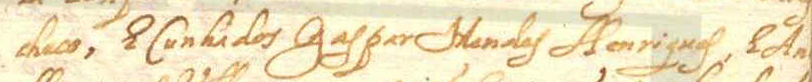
checo, E Cunhados Gaspar Mendes Henriques, E An
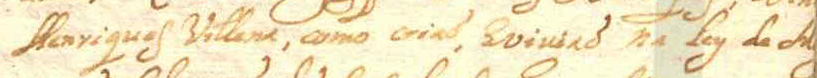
Henriques Villena, como criaõ, E viuiaõ na Ley de
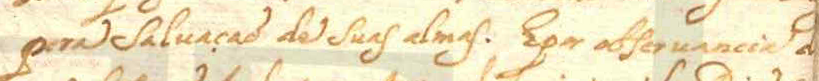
pera Saluaçaõ de suas almas. E por obseruancia d
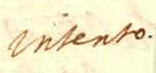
intento.
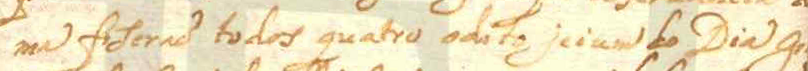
ma fiseraõ todos quatro o dito jeium do Dia Gr
